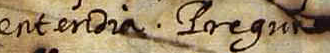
entendia. Pregun
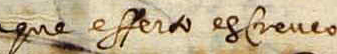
que effeito esCreueo
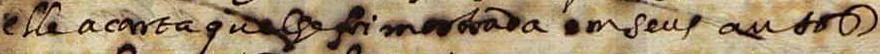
elle a carta que lhe foi mostrada em seus autos
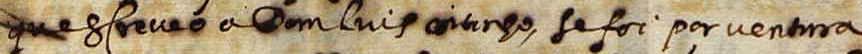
que esCreueo a Dom luis coitinho, se foi por uentura
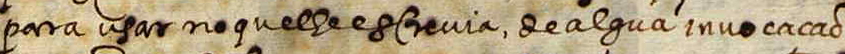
para usar no que lhe esCreuia, de alguā inuocaçaõ
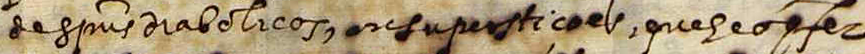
de spūs diabolicos, ou superstiçoẽs, que he o q̄ fez
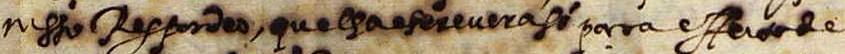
nisso Respondeo, que lhe escreuera só para effeito de
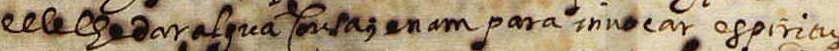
elle lhe dar alguā Cousa; e nam para inuocar espiritus
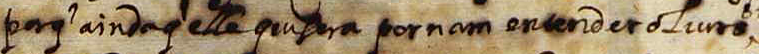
porq̄ ainda q̄ elle quisera por nam entender o Liuro,
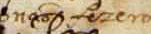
o não fezera
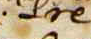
Pre
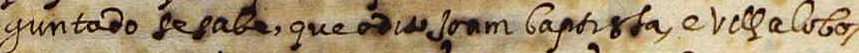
guntado se sabe, que o dito Joam baptista, e vilhalobos
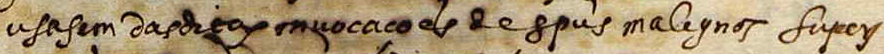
usasem das ditas inuocaçoẽs de spūs malegnos supers
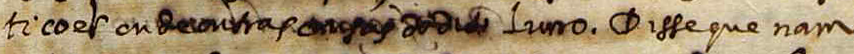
tiçoẽs ou de outras cousas do dito Liuro. Disse que nam
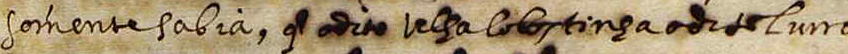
somente sabia, q̄ o dito vilhalobos tinha o dito liuro
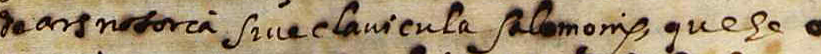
de ars notoria siue clauicula salomonis, que he o
